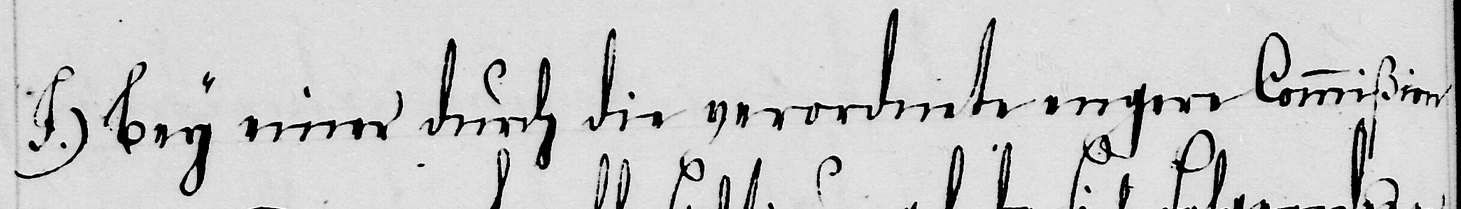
F.) Bey einer durch die verordnete engere Commißion
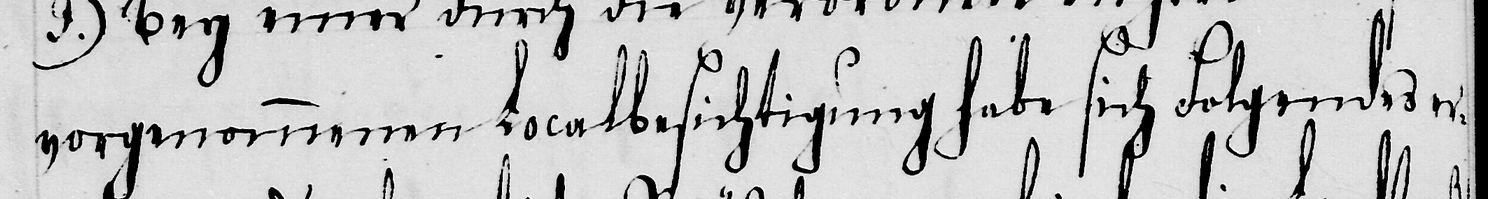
vorgenommenen Localbesichtigung habe sich Folgendes er¬
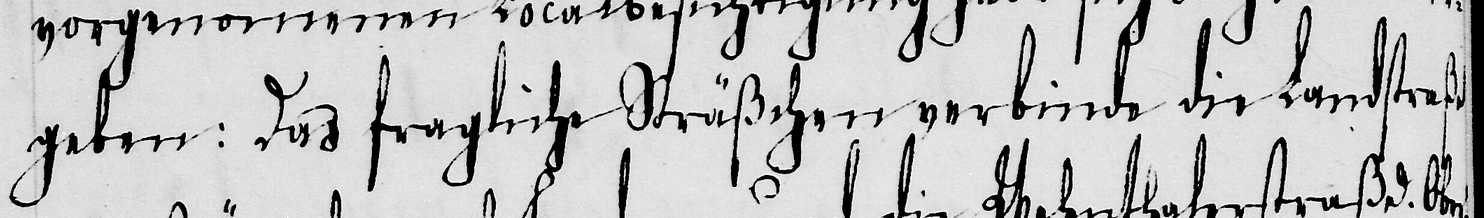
geben: Das fragliche Sträßchen verbinde die Landstra¬
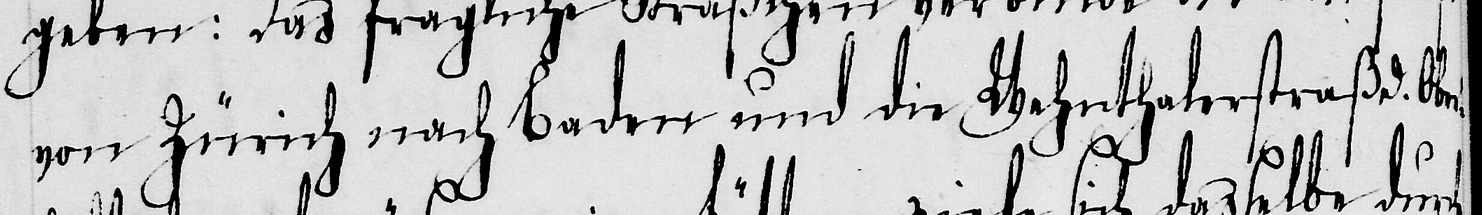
von Zürich nach Baden und die Wehnthalerstraße. Ob¬
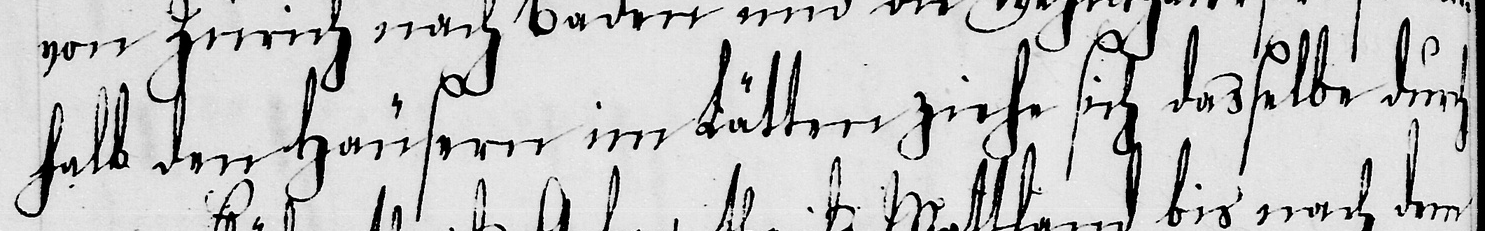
halb den Häusern im Lätten ziehe sich dasselbe du¬
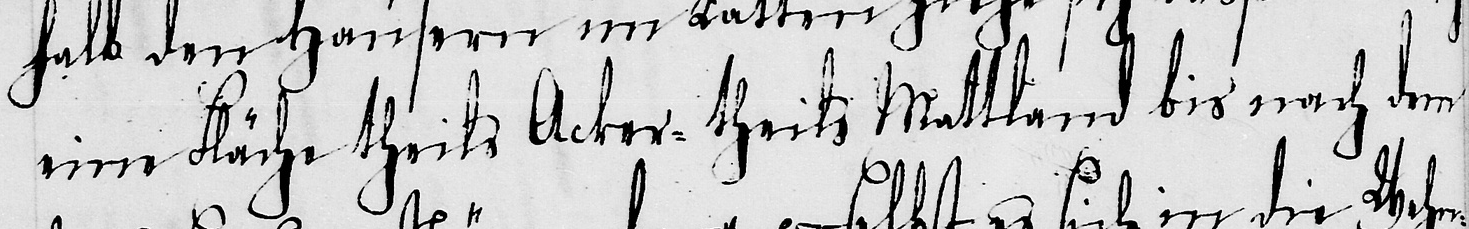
eine Fläche theils Acker- theils Mattland bis nach dem
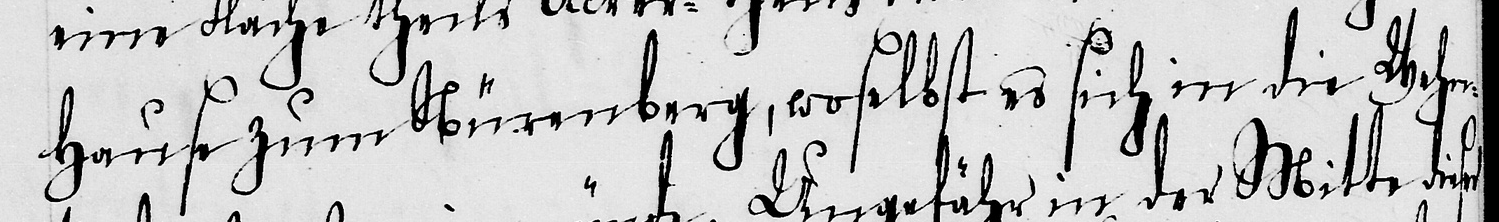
Hause zum Nürenberg, woselbst es sich in die Wehn¬
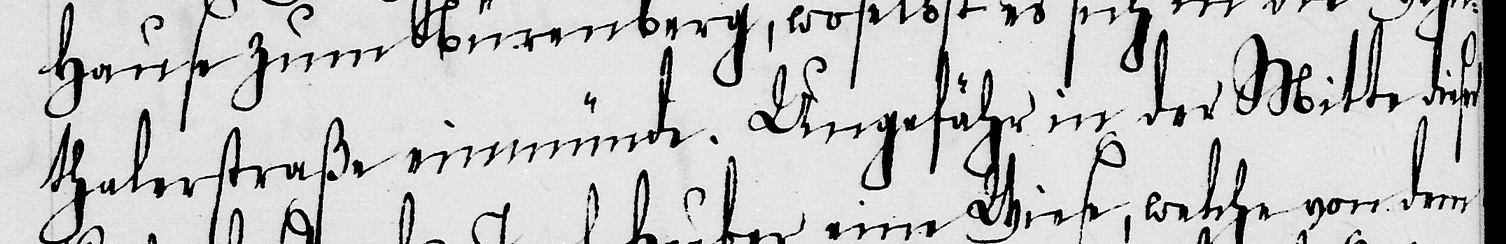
thalerstraße einmünde. Ungefähr in der Mitte die¬
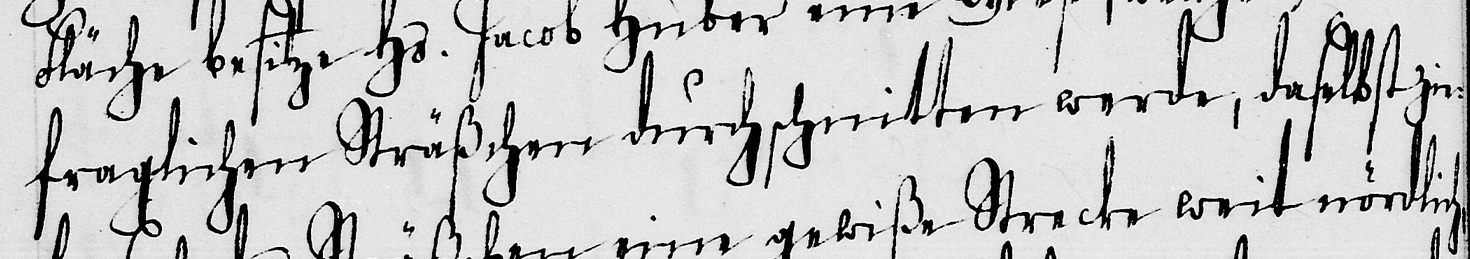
fraglichen Sträßchen durchschnitten werde, daselbst
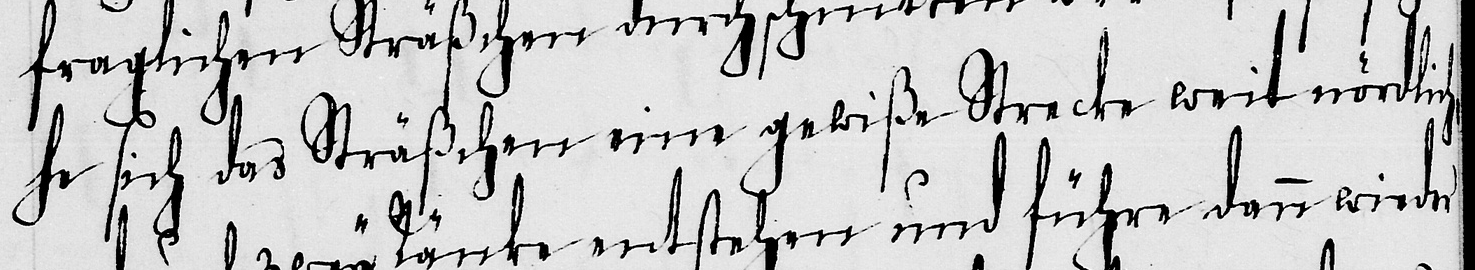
he sich das Sträßchen eine gewiße Strecke weit nördli¬
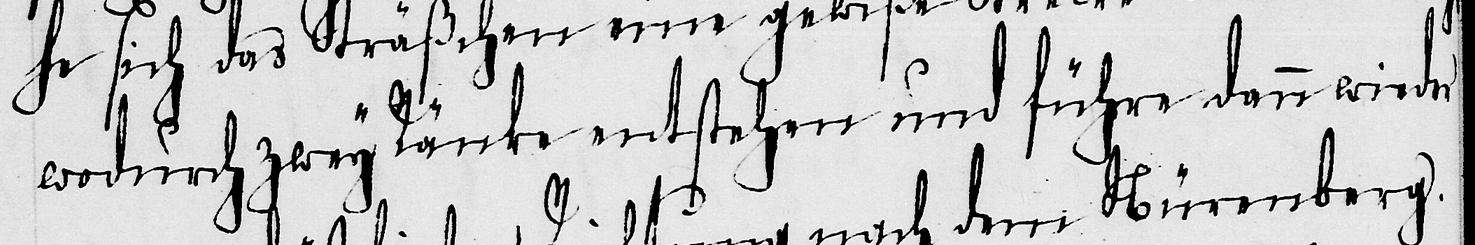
wodurch zwey Ränke entstehen und führe dann wieder
